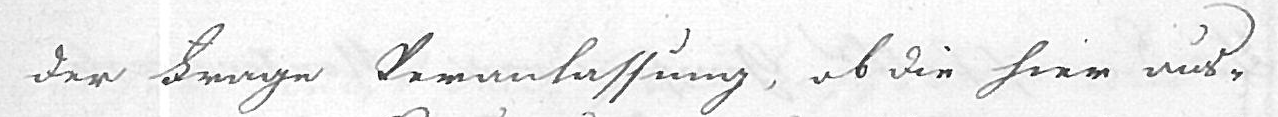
der Frage Veranlassung, ob die hier aus-
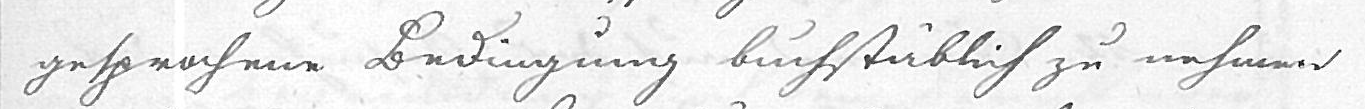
gesprochene Bedingung buchstäblich zu nehmen
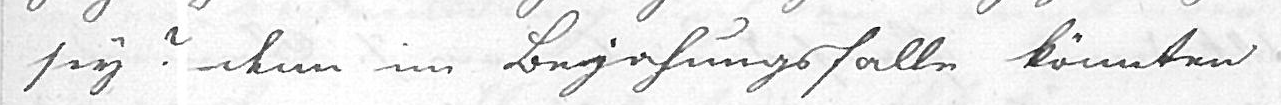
sey? Denn im Bejahungsfalls könnten
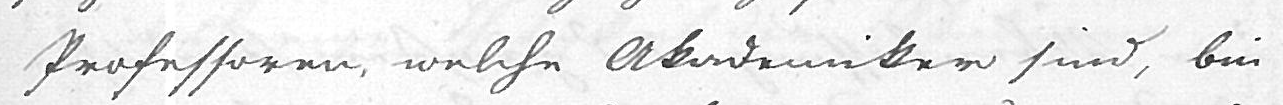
Professoren, welche Akademiker sind, bei
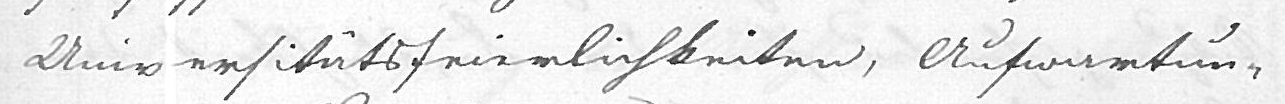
Universitätsfeierlichkeite, Aufwartun-
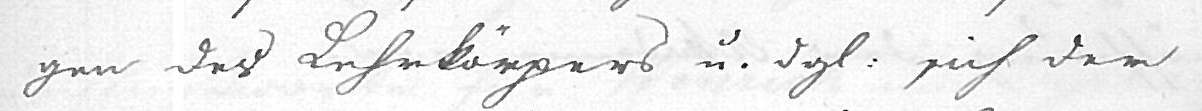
gen des Lehrkörpers u. dgl. sich der
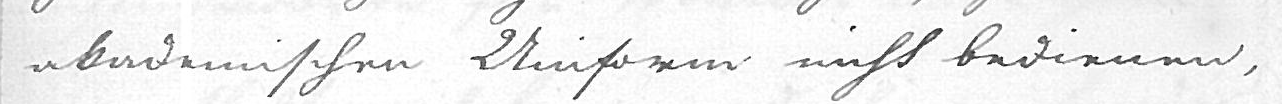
akademischen Uniform nicht bedienen,
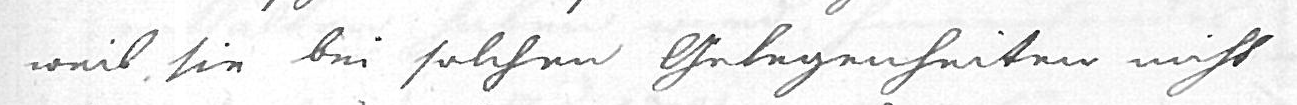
weil sie bei solchen Gelegenheiten nicht
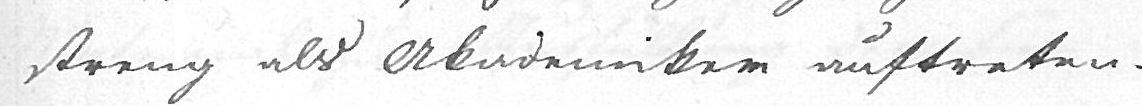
streng als Akademiker auftreten.
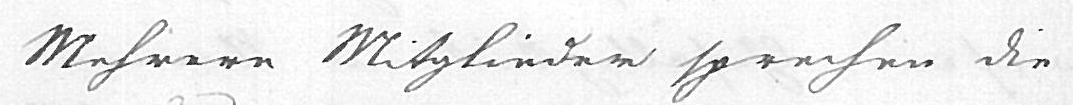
Mehrere Mitglieder sprechen die
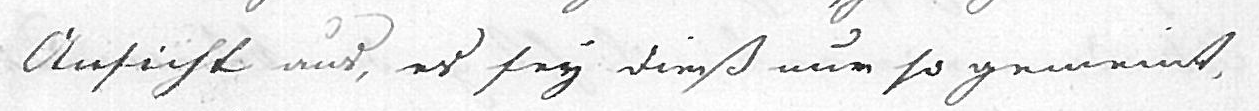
Ansicht aus, es sey dieß nur so gemeint,
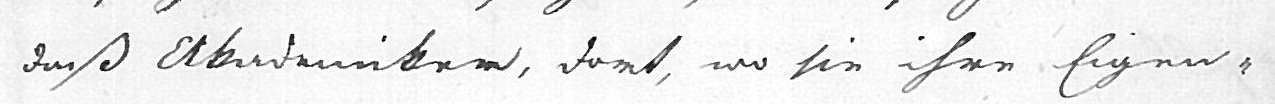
daß Akademiner, dort, wo sie ihre Eigen-
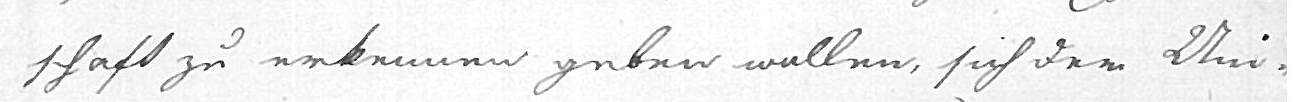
schaft zu erkennen geben wollen, sich der Uni-
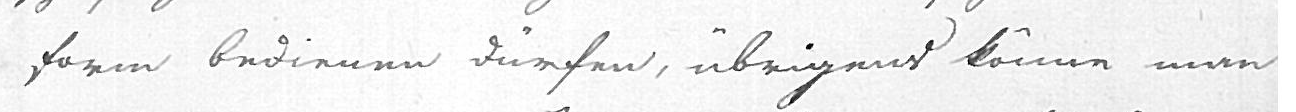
form bedienen dürfen, übrigens können man
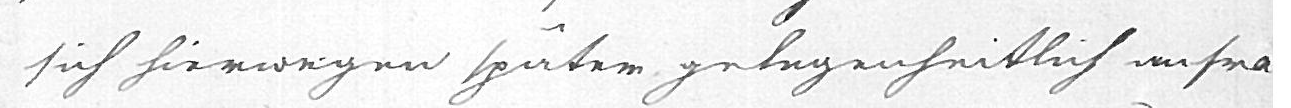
sich hierwegen später gelegenheitlich aufma-
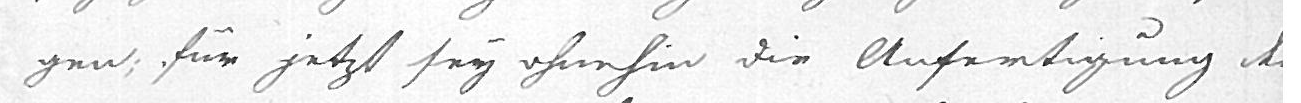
chen, für jetzt sey ohnehin die Anfertigung der
